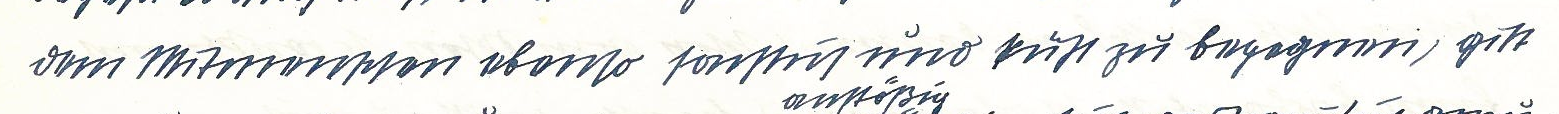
dem Mitmenschen ebenso sachlich und kühl zu begegnen, gilt
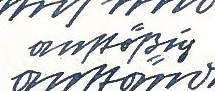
anstößig
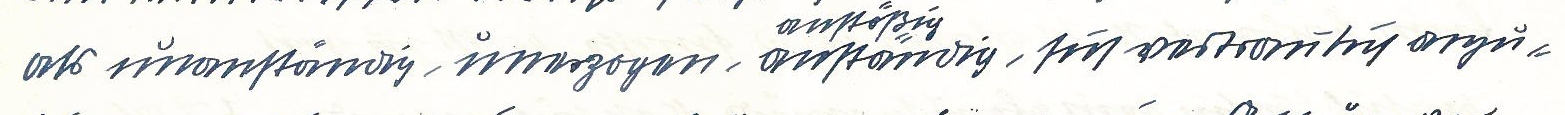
als unanständig, unerzogen, anständig, sich vertraulich anzu¬
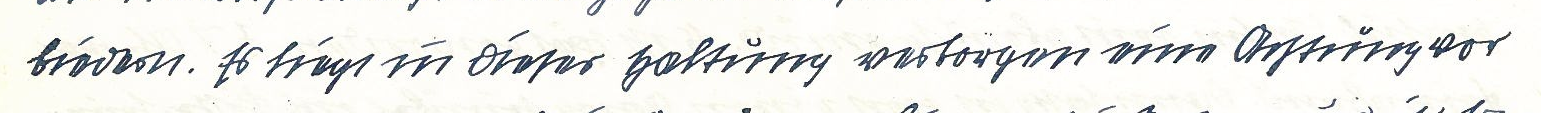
biedern. Es liegt in dieser Haltung verborgen, eine Achtung vor
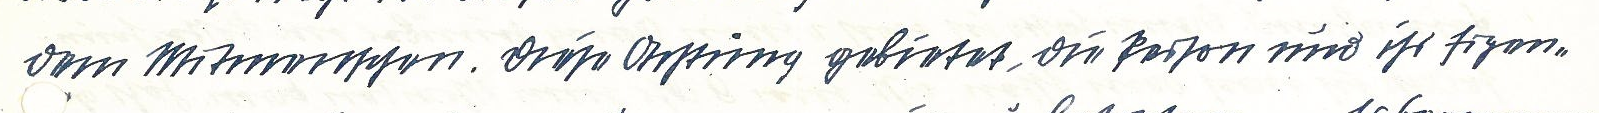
dem Mitmenschen. Diese Achtung gebietet, die Person und ihr Eigen¬
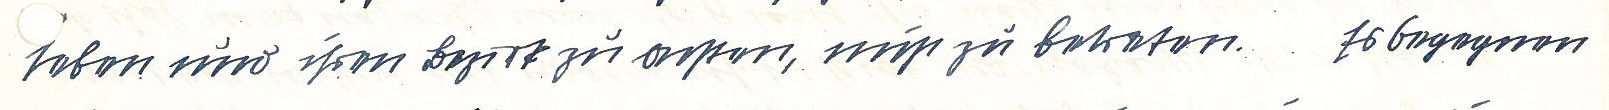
leben und ihren Bezirk zu achten, nicht zu betreten. Es begegnen
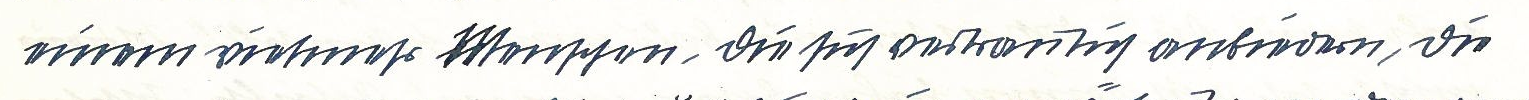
einem vielmehr Menschen, die sich verständig anbiedern, die
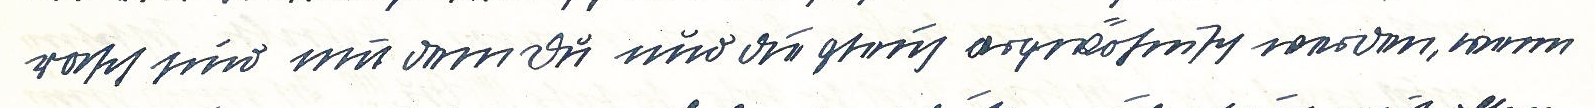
vosch sind mit dem du und die gleich argwöhnisch werden, wenn
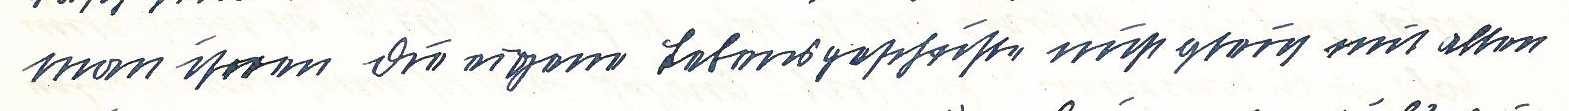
man ihnen die eigene Lebensgeschichte nicht gleich mit allen
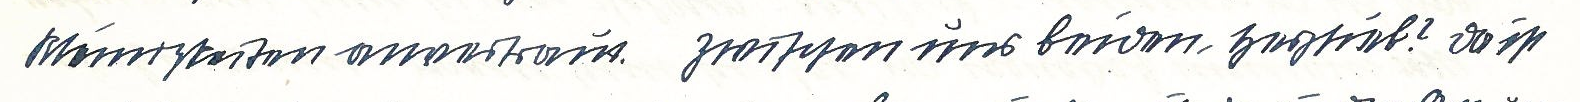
Kleinigkeiten anvertraut. Zwischen uns beiden, Herzlieb? Da ist
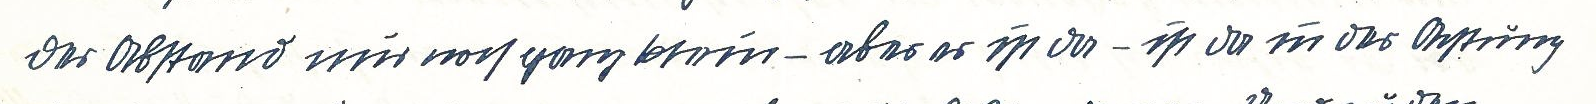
der Abstand nur noch ganz klein – aber er ist da – ist da in der Achtung
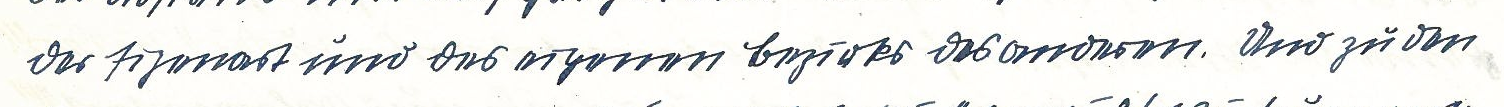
der Eigenart und des eigenen Bezirks des anderen. Und zu den
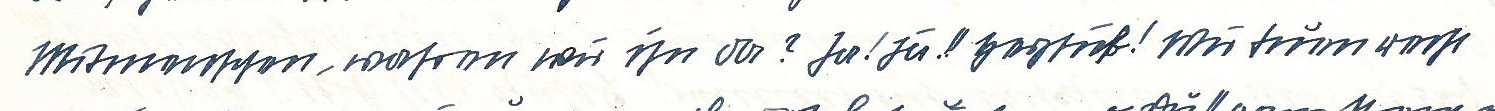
Mitmenschen, wahren wir ihn da? Ja! ja!! Herzlieb! Wir tuen recht
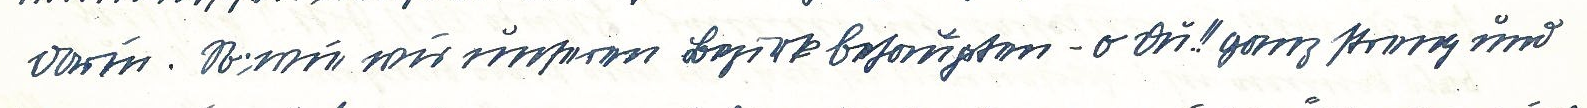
darin. So; wie wir unseren Bezirk behaupten – o Du!! ganz streng und
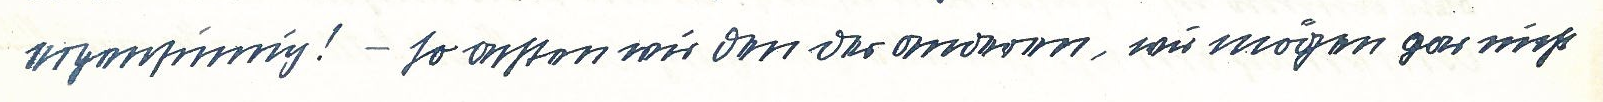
eigensinnig! – So achten wir den des anderen, wir mögen gar nicht
